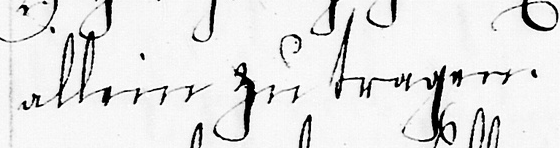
allein zu tragen:
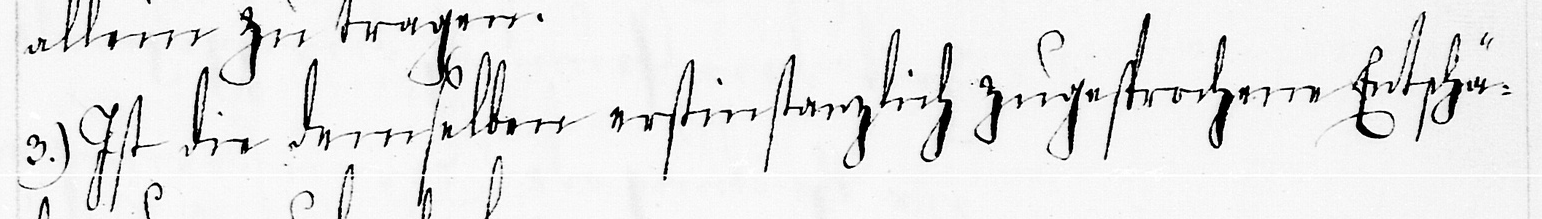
3.) Ist die demselben erstinstanzlich zugesprochene Entschä¬
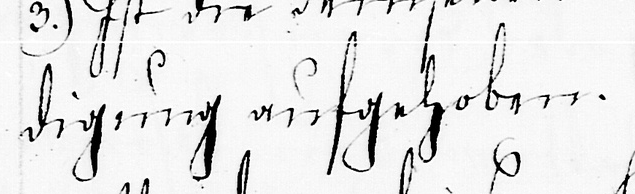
digung aufgehoben.
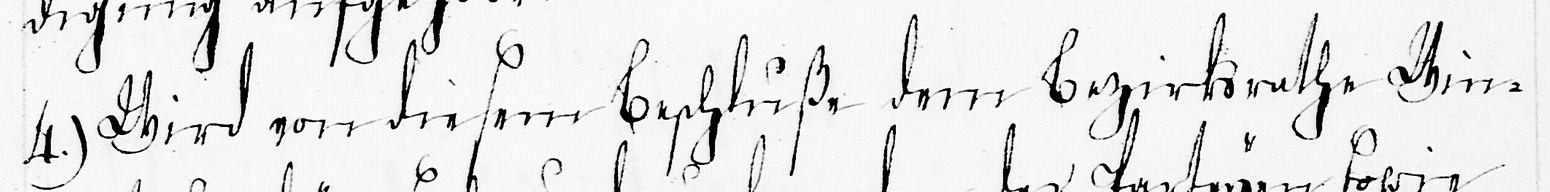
4.) Wird von diesem Beschluße dem Bezirksrathe Win¬
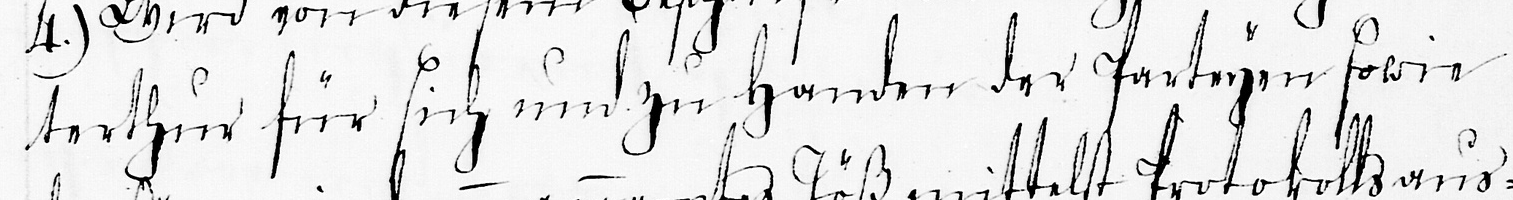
terthur für sich und zu Handen der Parteyen sowie
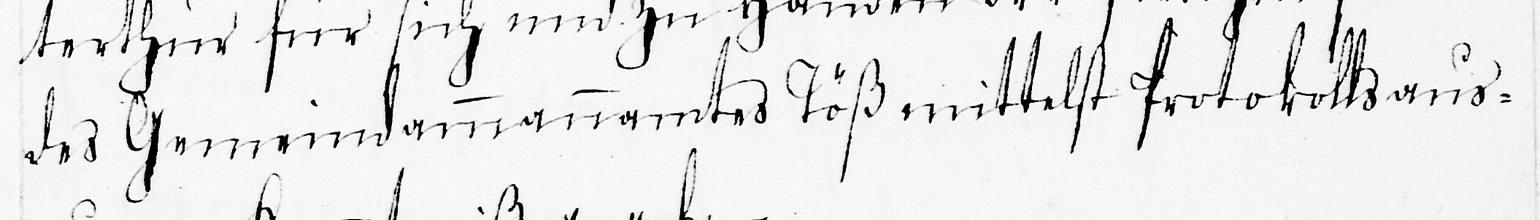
des Gemeindeammannamtes Töß mittelst Protokollsaus¬
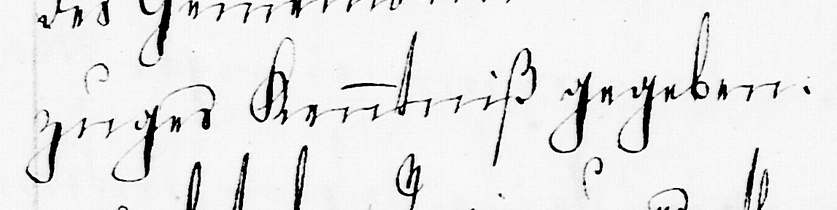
zuges Kenntniß gegeben.
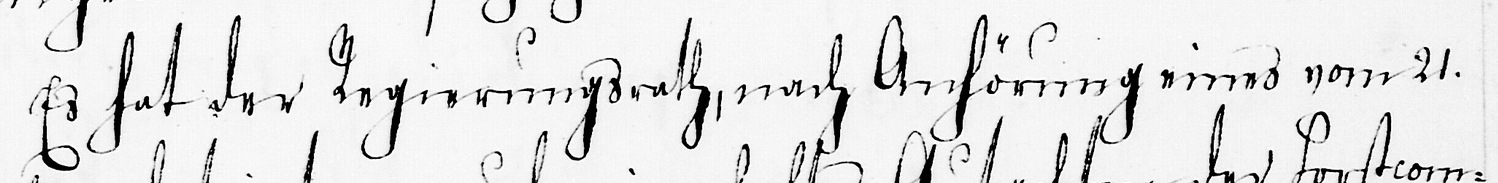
Es hat der Regierungsrath, nach Anhörung eines vom 21.
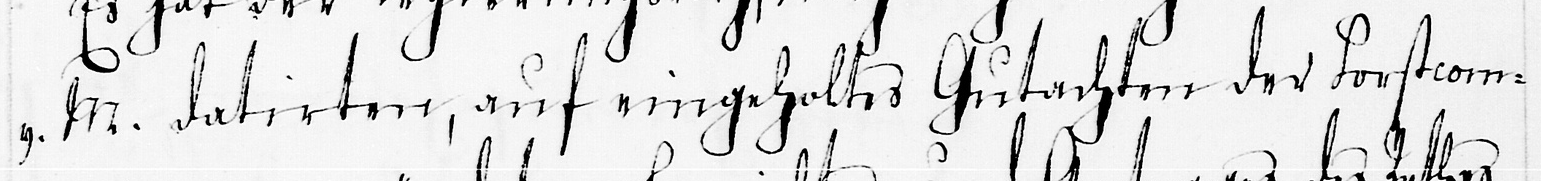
v. M. datirten, auf eingeholtes Gutachten der Forstcom¬
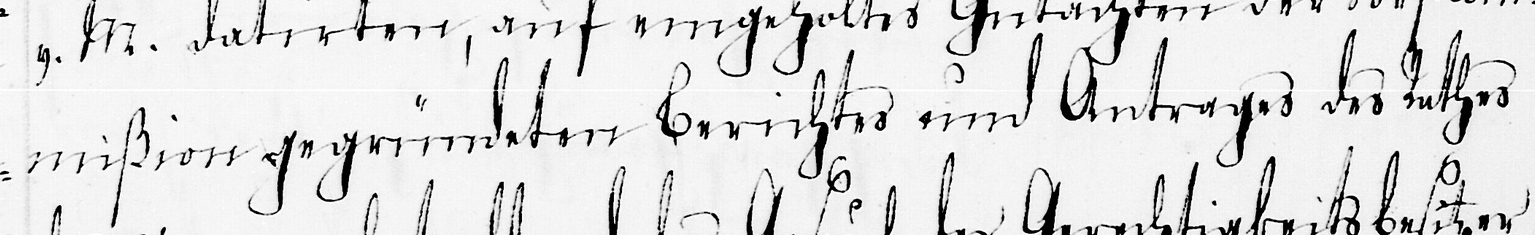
mißion gegründeten Berichtes und Antrages des Rathes
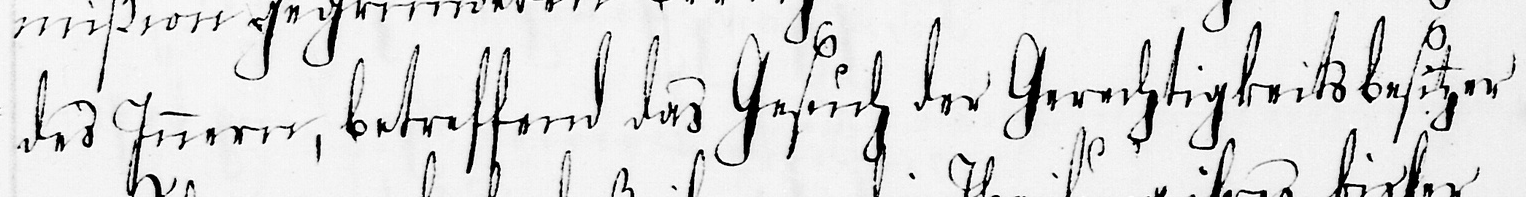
des Innern, betreffend das Gesuch der Gerechtigkeitsbesitzer
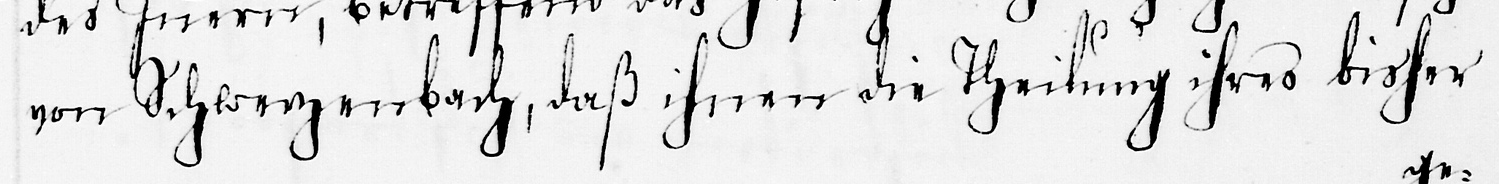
von Schwerzenbach, daß ihnen die Theilung ihres bisher
